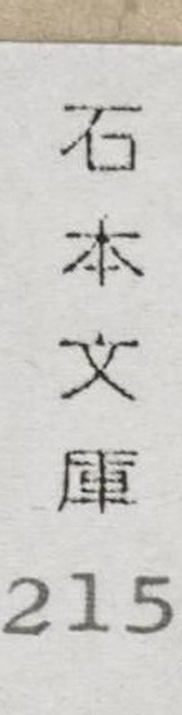石本文庫
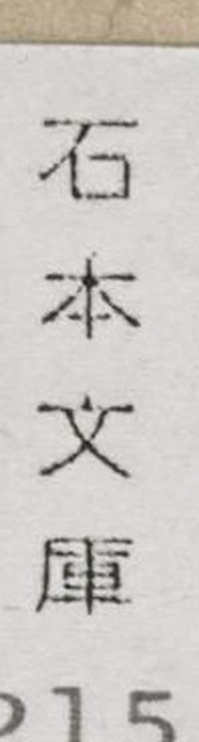石本文庫
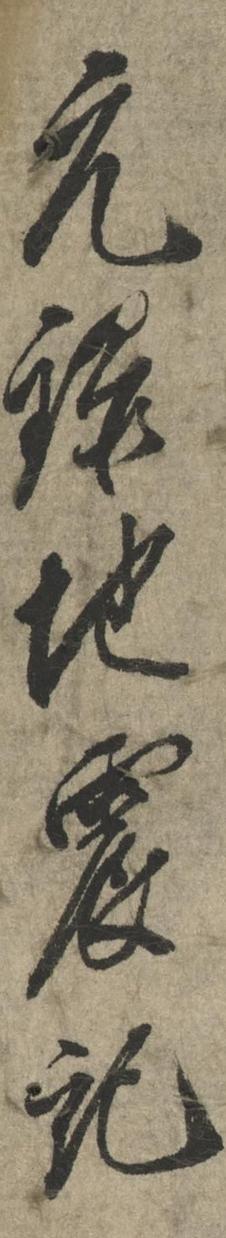元禄地震記

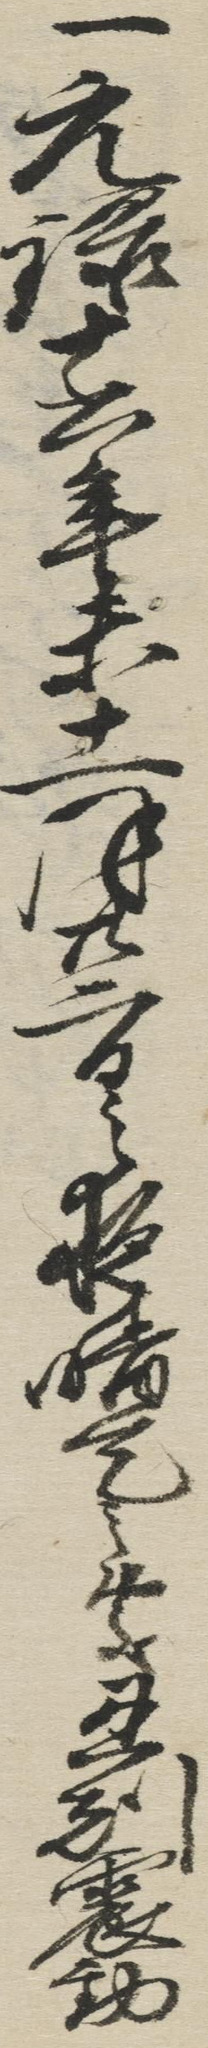一元禄十六年未十一月廿二日之夜晴天之処丑刻震動
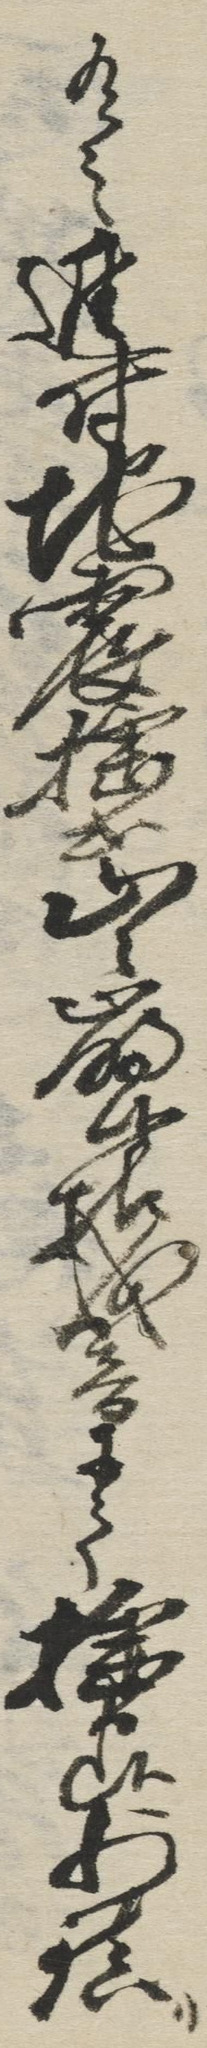有之候付地震揺出山々崩候様成音にて揺申候少鎮リ
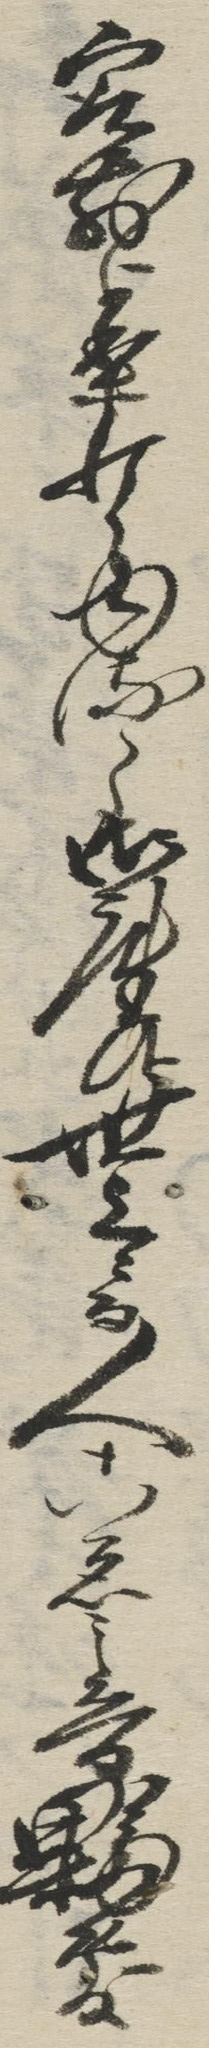最前より少之内なく御座候世上二而人こゑ之音夥敷
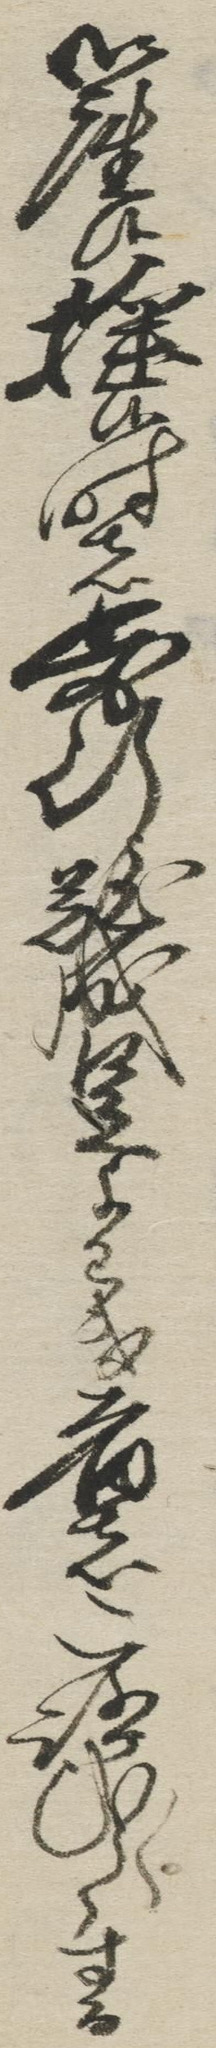御座候揺候時は歩行難成足よわき者はころひ〳〵する
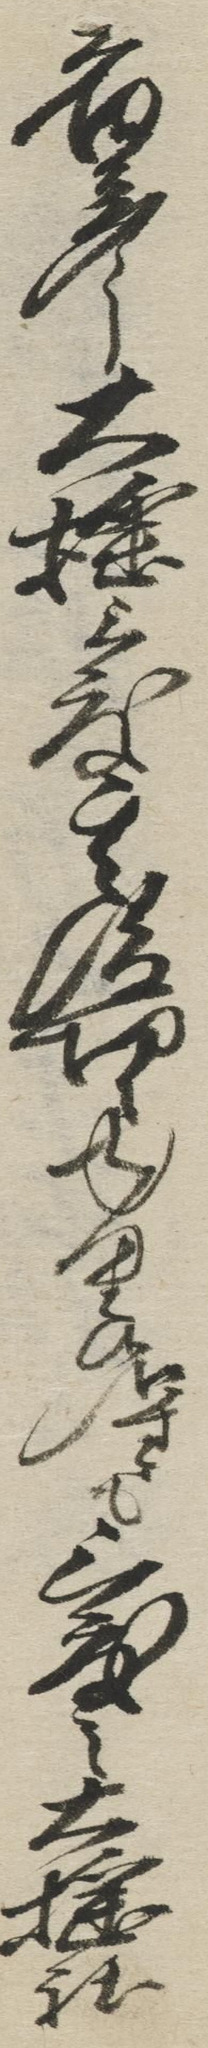者多く大揺三度其後切たり候得とも三度之大揺致
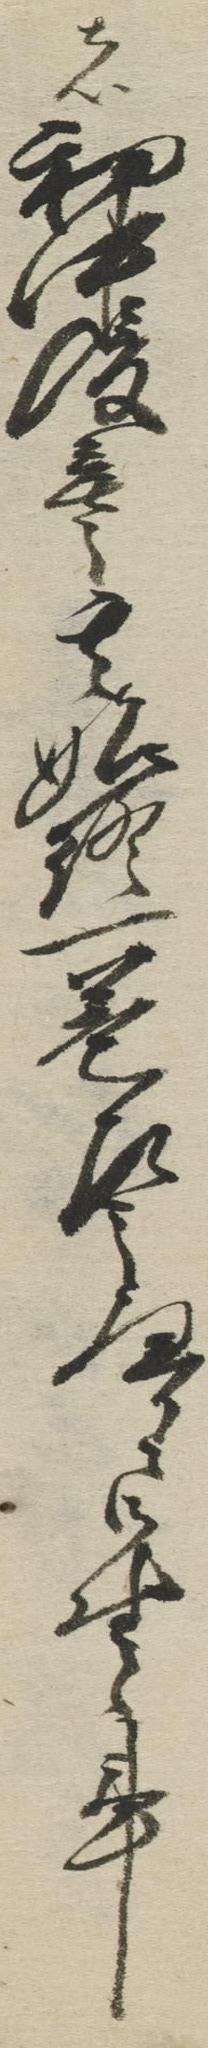は初中後無之其始終一巻右之通り二御坐候事
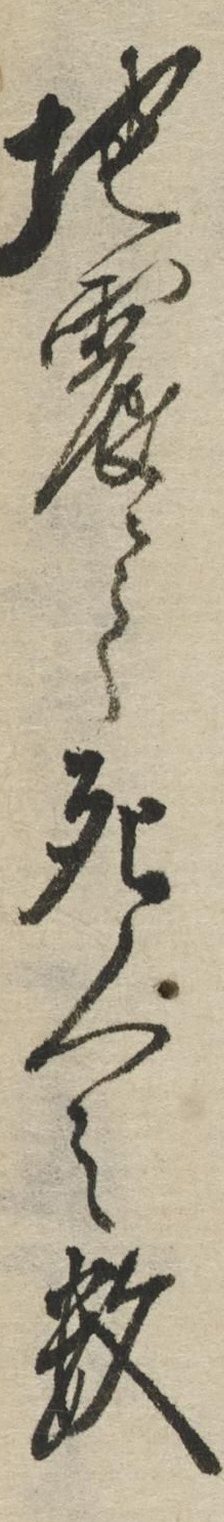地震二て死人之数

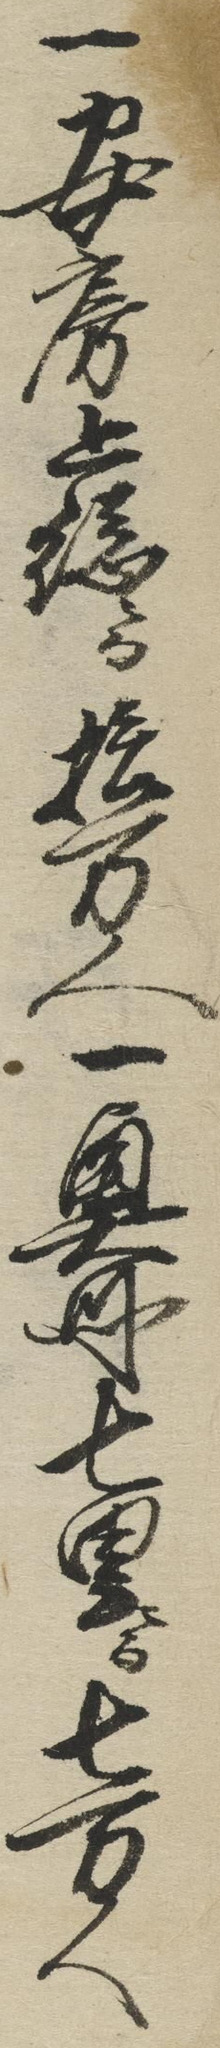一安房上総ニテ拾万人一奥州七里ニテ七万人
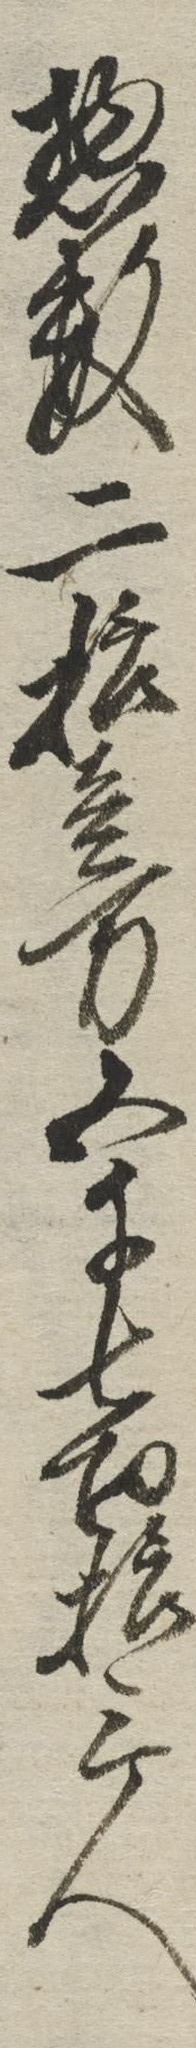惣数二拾壱万五千七百拾三人
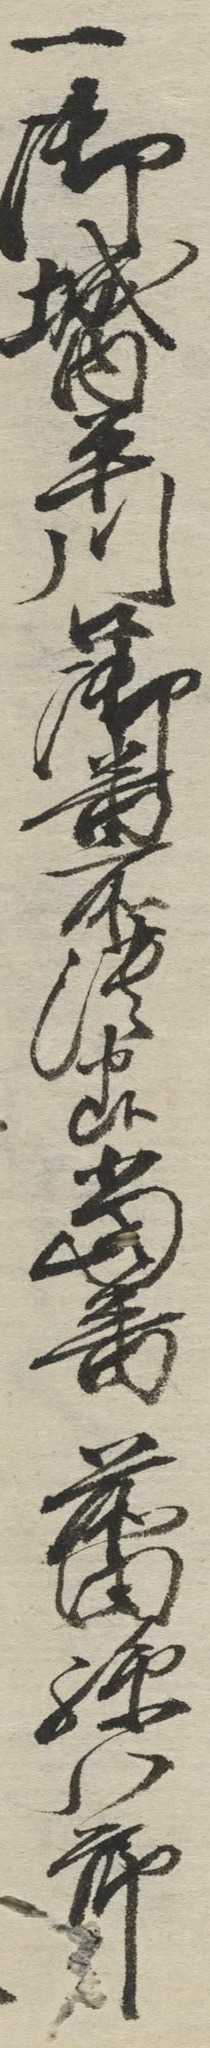一御城内平川口御番所潰申候当番前田孫八郎
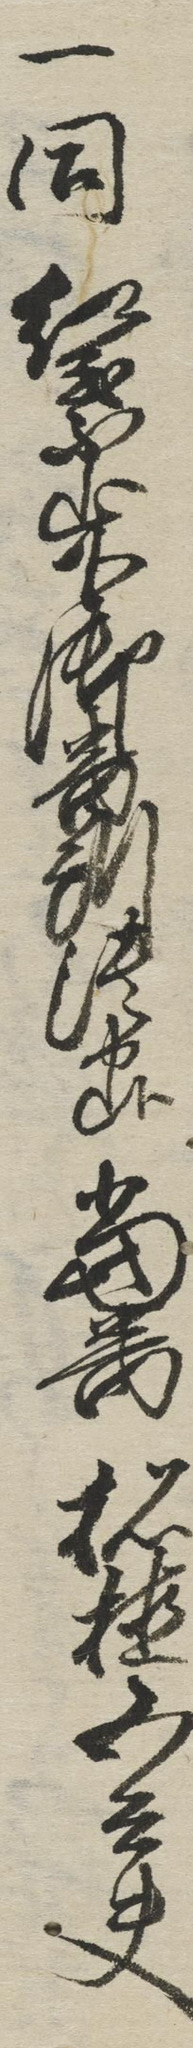一同紅葉山下御番所潰申候当番拓殖五太夫
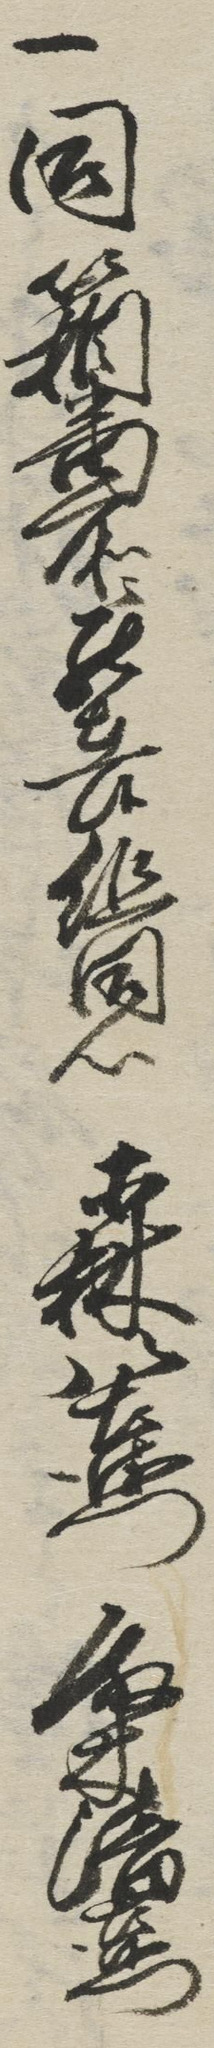一同箱番所ニ罷在候組同心森八左衛門細木清左衛門
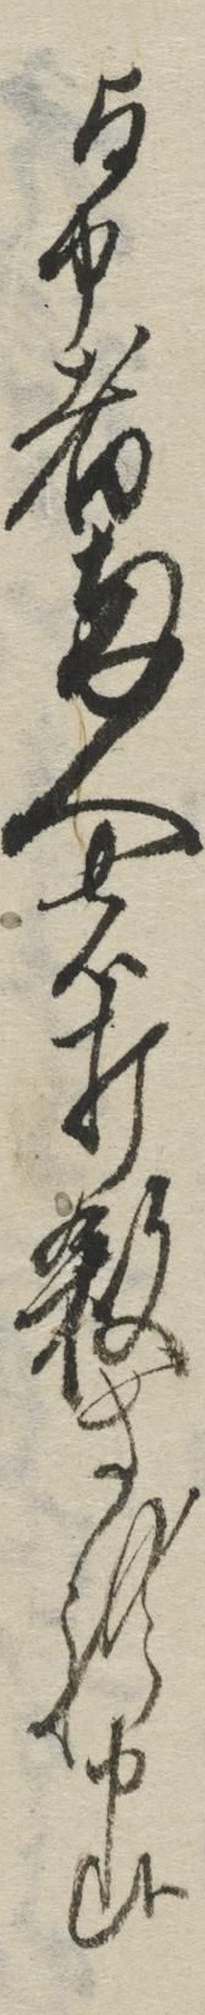与申者両人者打殺され申候
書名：元禄地震記
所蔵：東京大学地震研究所図書室 Earthquake Research Institute Library, The University of Tokyo, JAPAN
